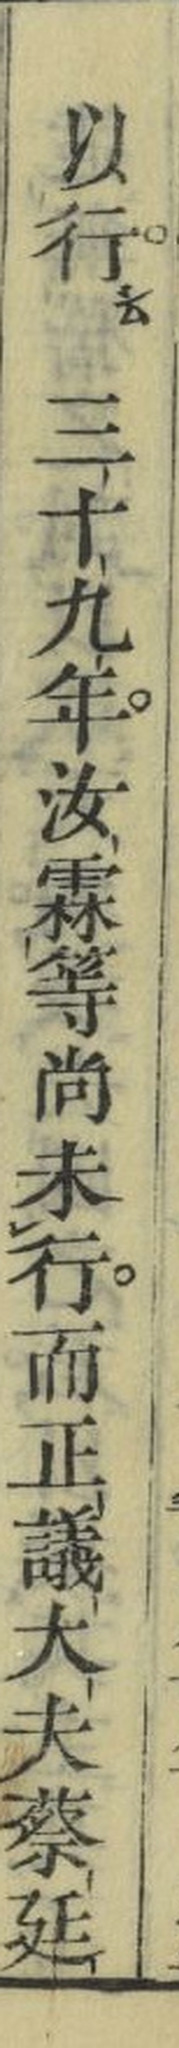以行。三-十-九-年。汝-霖-等尚未行。而正-議-大-夫蔡-廷-

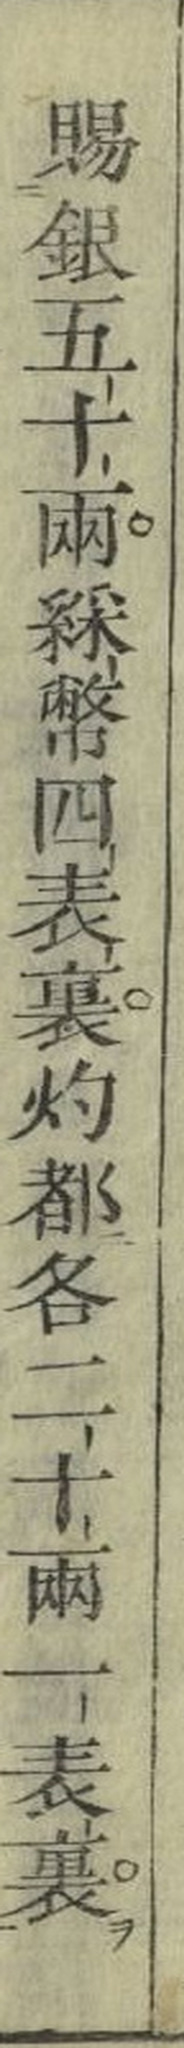賜銀五-十-両。綵-幣四-表-裏。灼都各二-十-両一-表-裏。

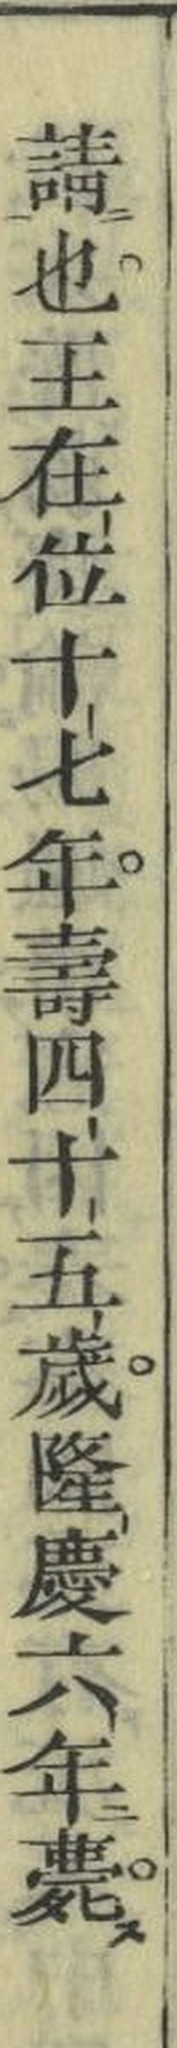請也。王在-位十-七年。寿四-十-五-歳。隆-慶六-年薨。
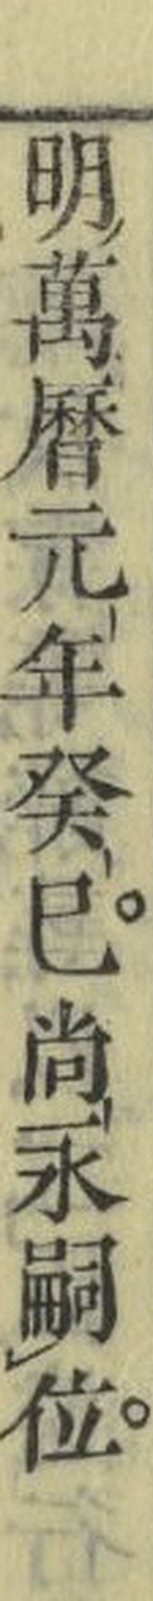明万-暦元-年癸-巳。尚-永嗣位。
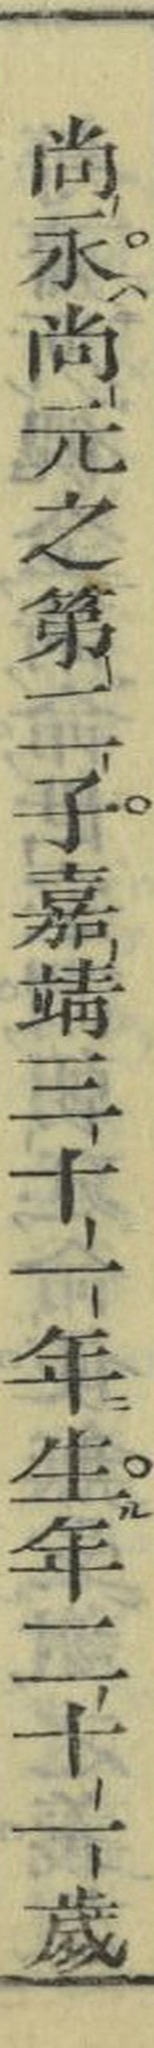尚-永。尚-元之第-二-子。嘉-靖三-十-一-年生。年二-十-一-歳

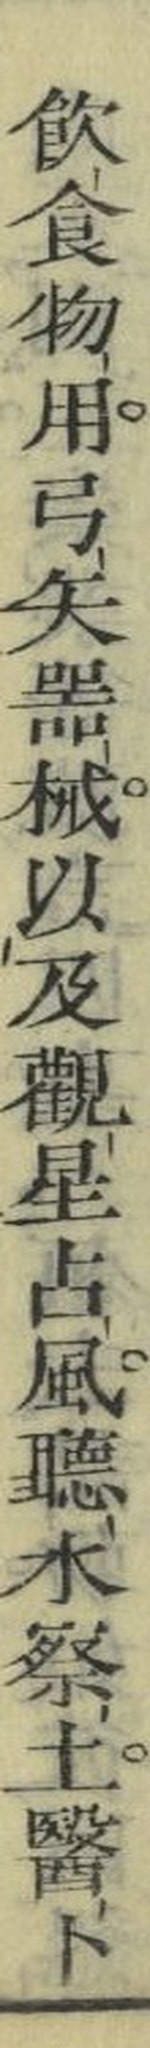飲-食物-用。弓-矢器-械。以-及観-星占-風。聴-水察-土。医-卜

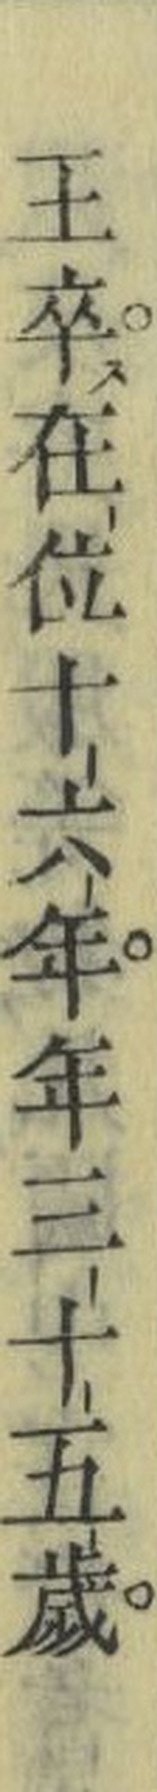王卒。在-位十-六-年。年三-十-五-歳。
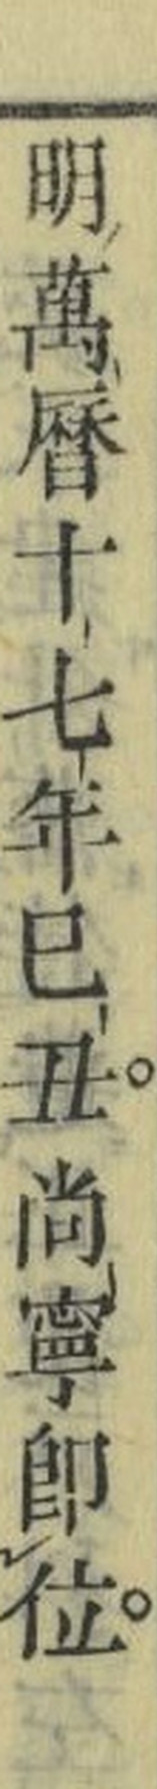明万-暦十-七-年巳-丑。尚-寧即位。
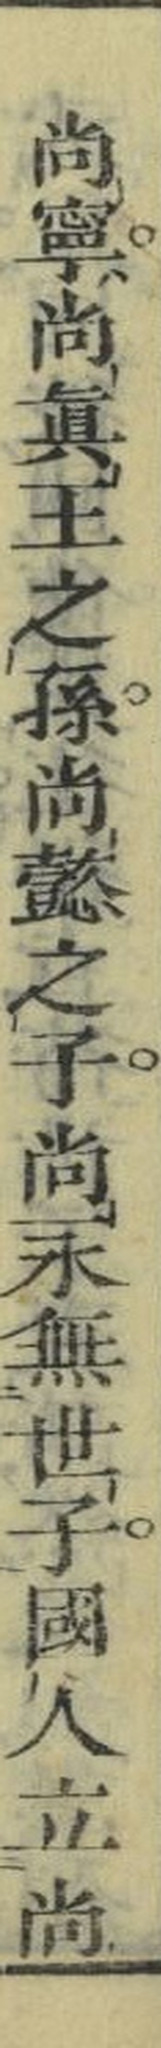尚-寧。尚-真-王之-孫。尚-懿之-子。尚-永無世-子。国-人立尚-

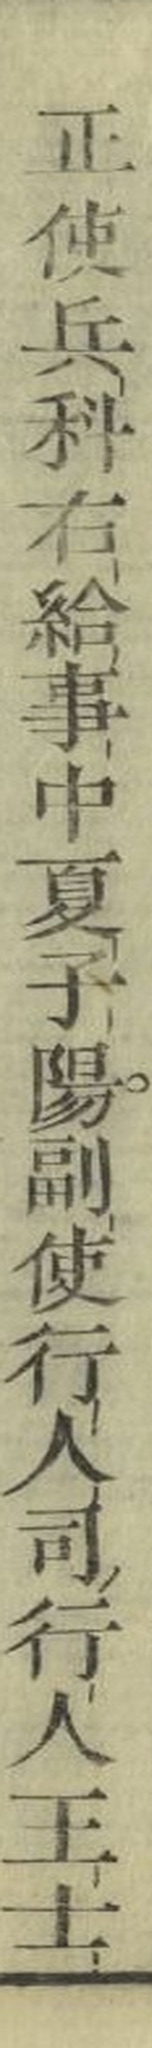正使兵-科右-給-事-中夏-子-陽。副-使行-人-司行-人王-士-

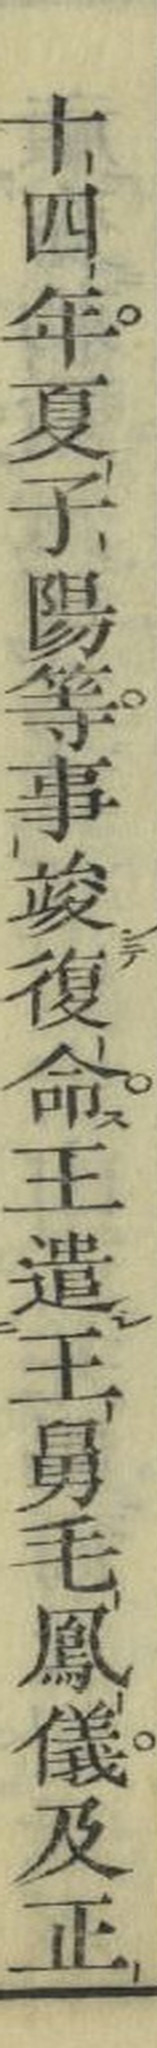十-四-年。夏-子-陽等。事-竣復-命。王遣王-舅毛-鳳-儀。及正-
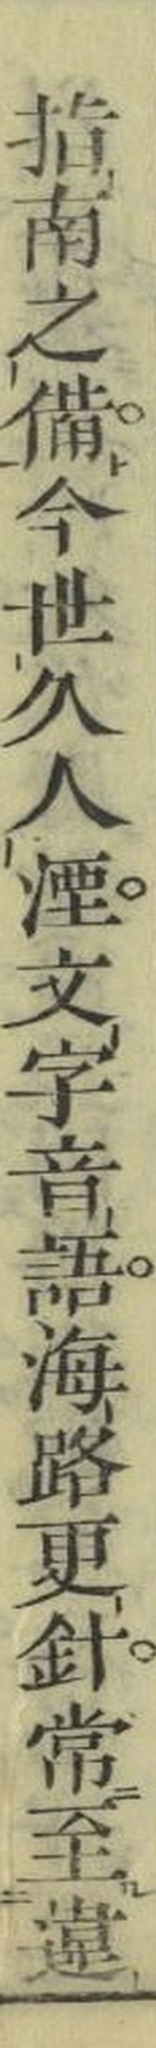指-南之-備。今世-久人-湮。文-字音-語。。海-路更-針。常至違-
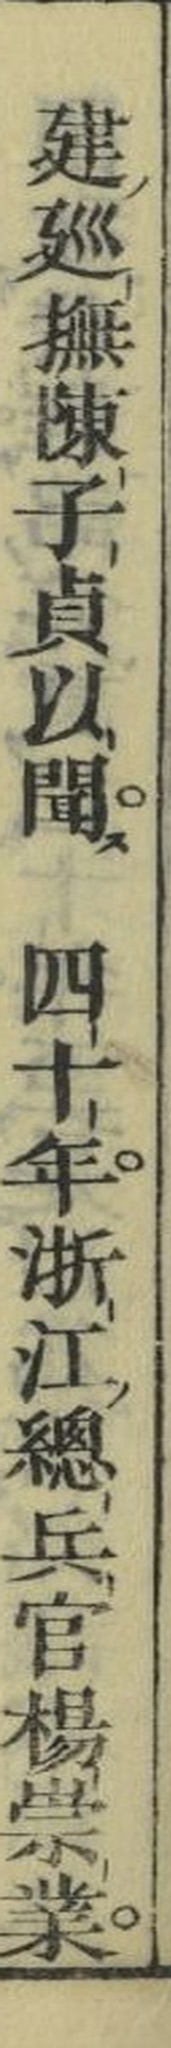建巡-撫陳-子-貞以-聞。四-十-年。浙-江総-兵-官楊-崇-業。

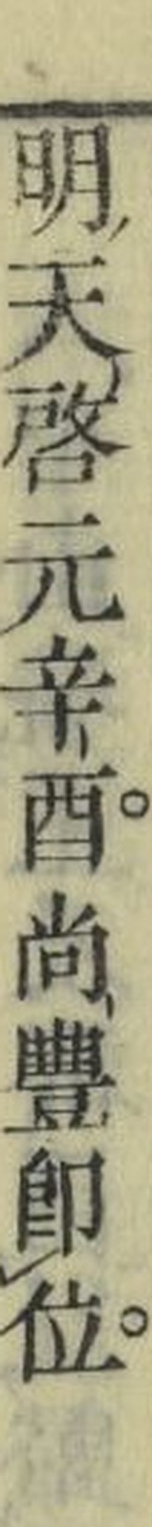明天-啓元辛-酉。尚-豊即位。

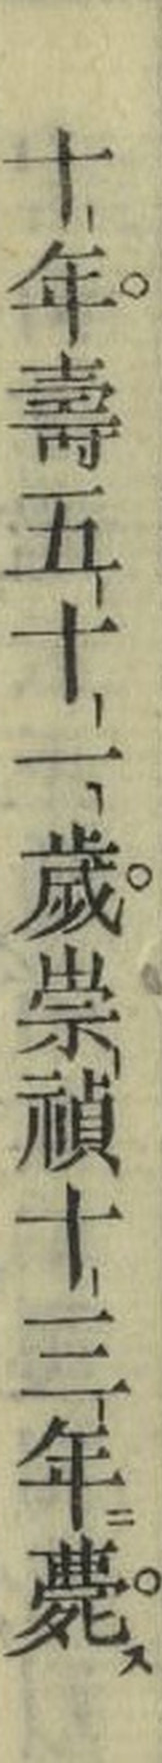十-年。寿五-十-一-歳。崇-禎十-三-年薨。
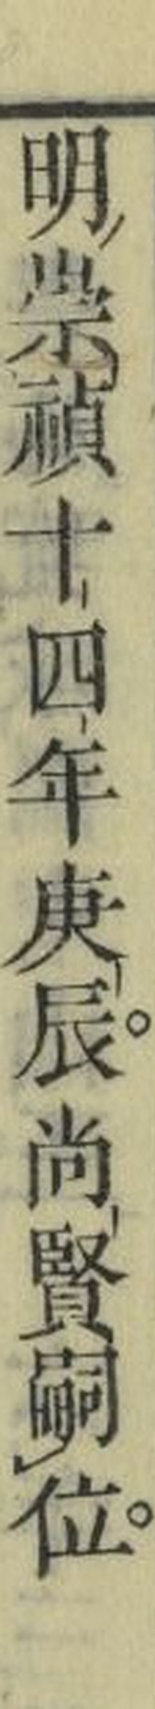明崇-禎十-四-年庚-辰。尚-賢嗣位。
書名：中山伝信録 巻三
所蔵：University of the Ryukyus Library
